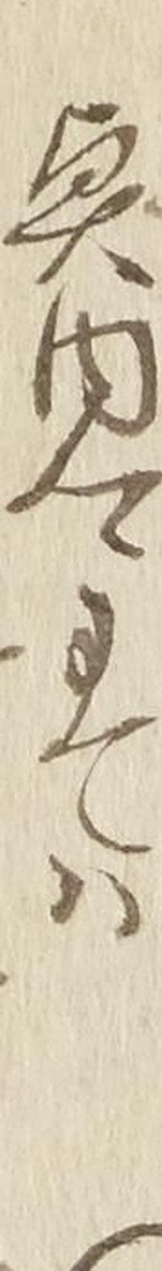奥内郷にては
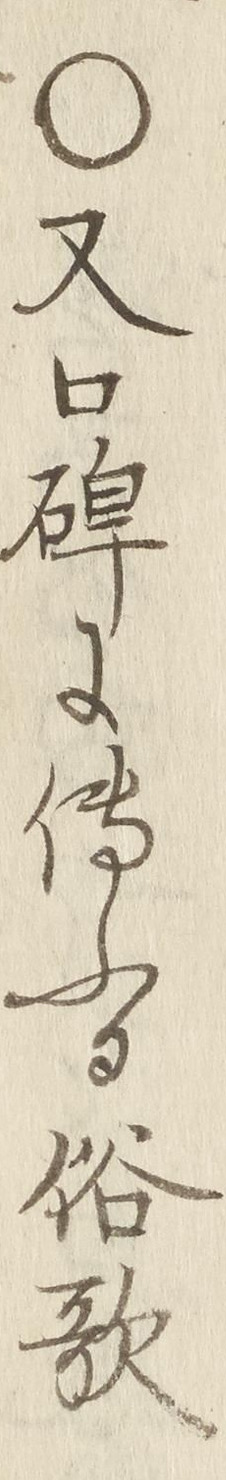〇又口碑に伝ふる俗歌
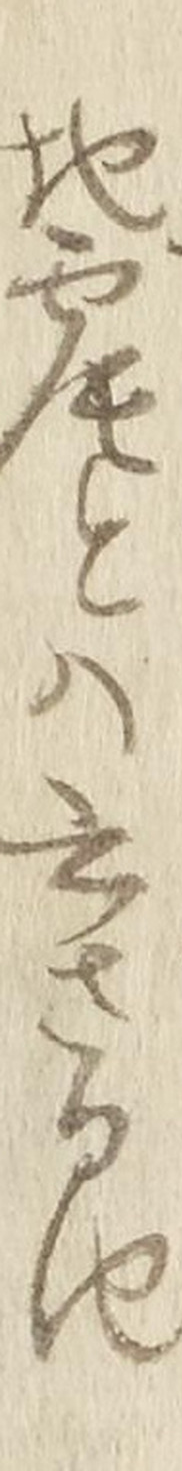地震とは云さる也
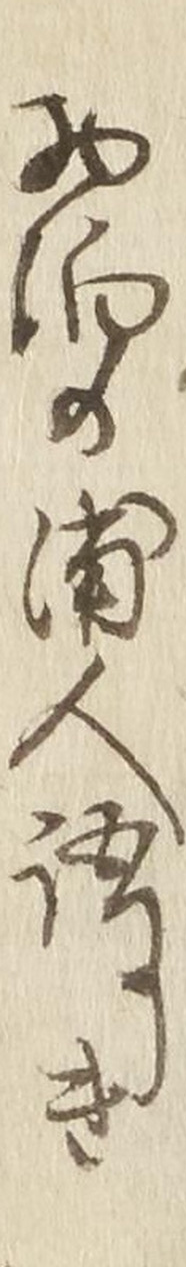西泊の浦人語りき
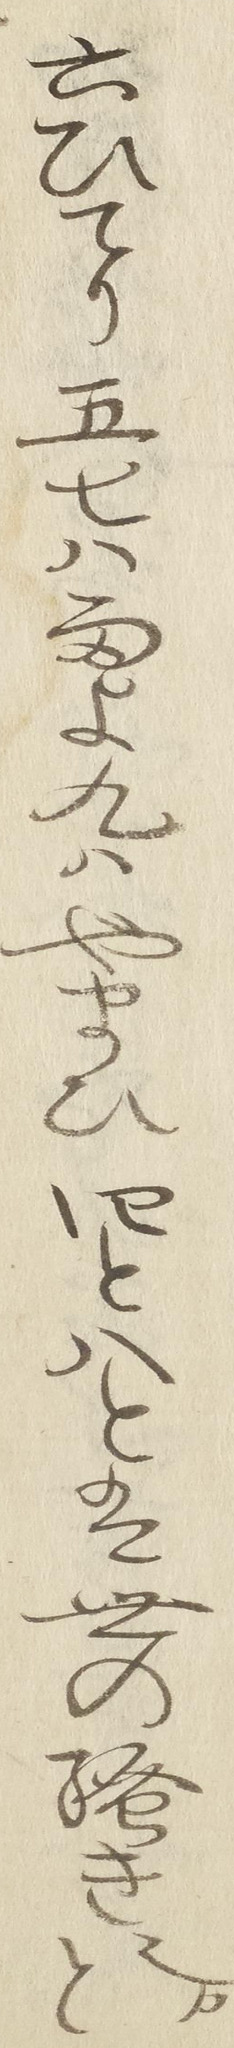六ひてり五七は雨よ九はやまひ四と八とは世の騒き也かと

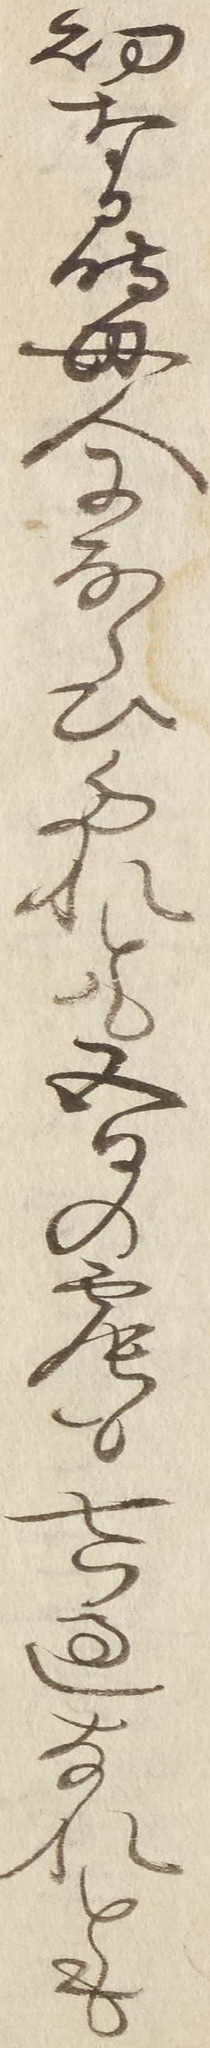幼なる時母人にならひたれとも五日の震も七ツ過なれとも
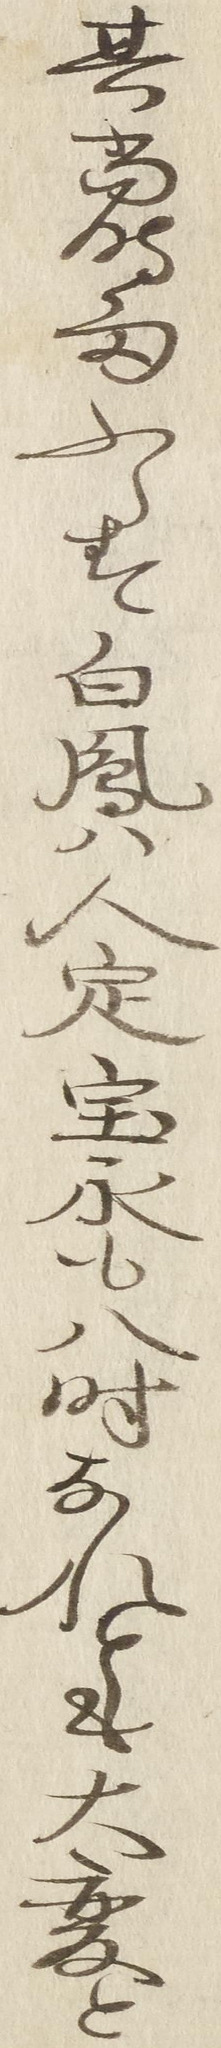其当時雨ふらす白鳳は人定宝永も八時なれとも大変と
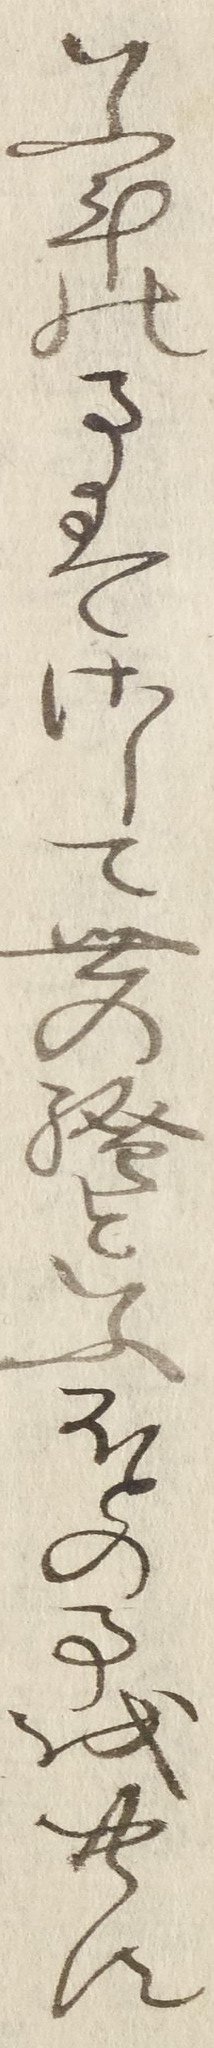いふ計の事にてさして世の騒といふほとの事を聞す
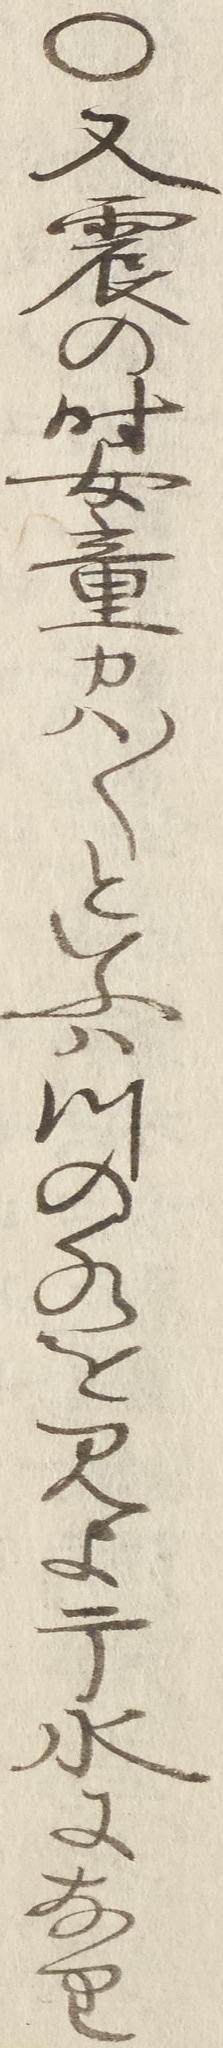〇又震の時女童かは〳〵といふは川の水わ見よ干水になり
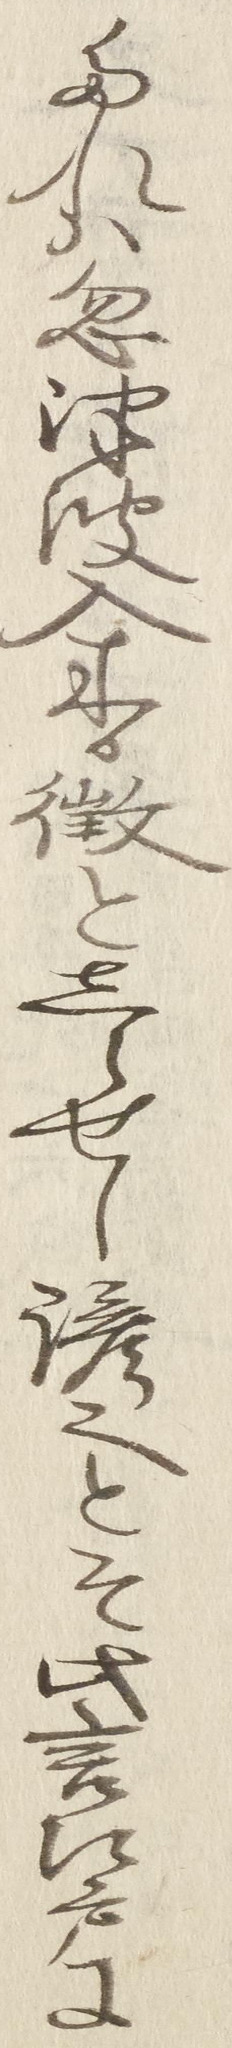たれは忽津波入来る徴としらせし諺也とそ此言江戸に
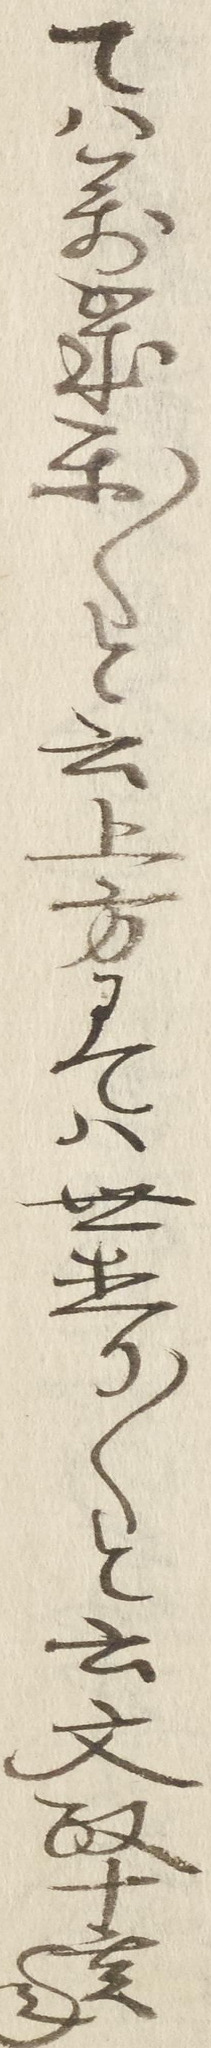ては万歳楽〳〵と云上方にては世直り〳〵と云文政十亥年
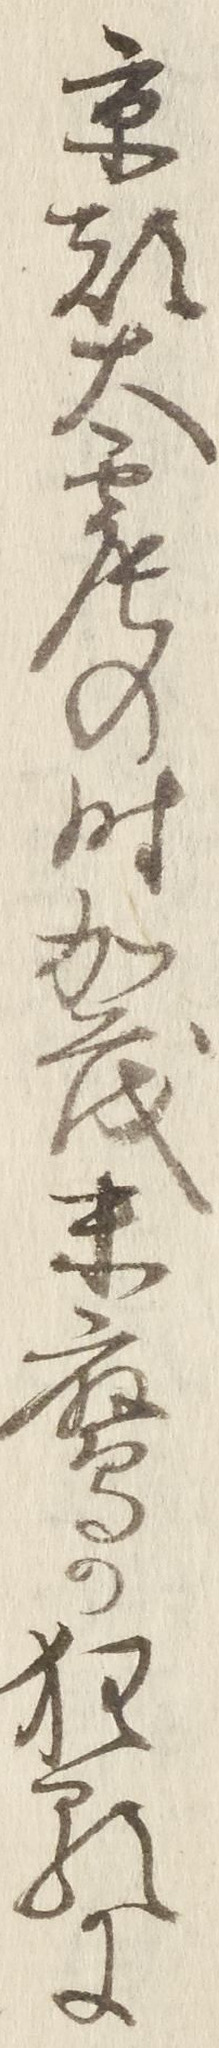京都大震の時加茂米鷹の狂歌に
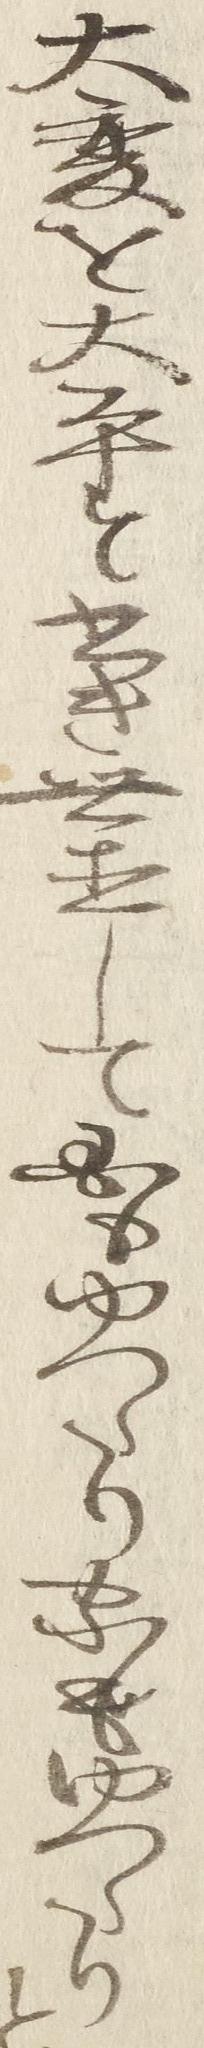大変を太平と書き世直して国もゆつたり家もゆつたりと
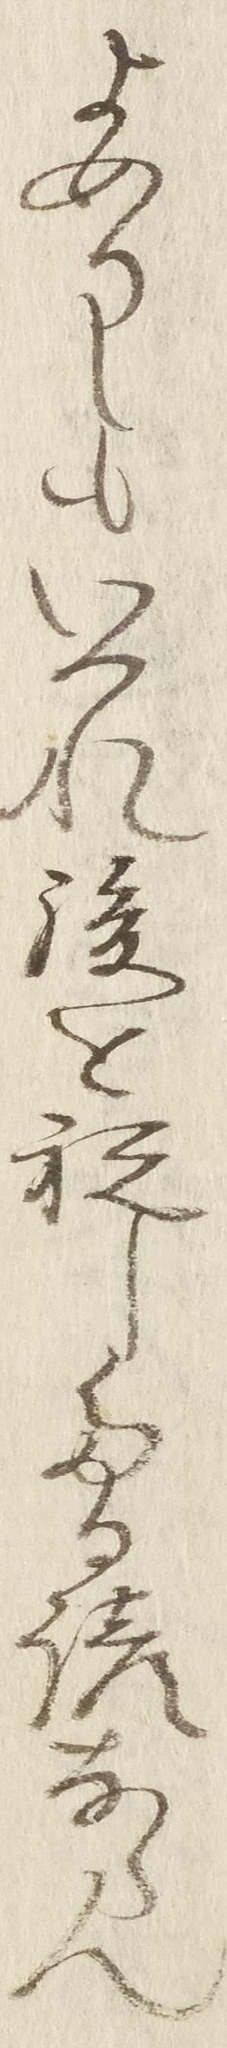よめりしもいつれ後を祝したる諺ならん
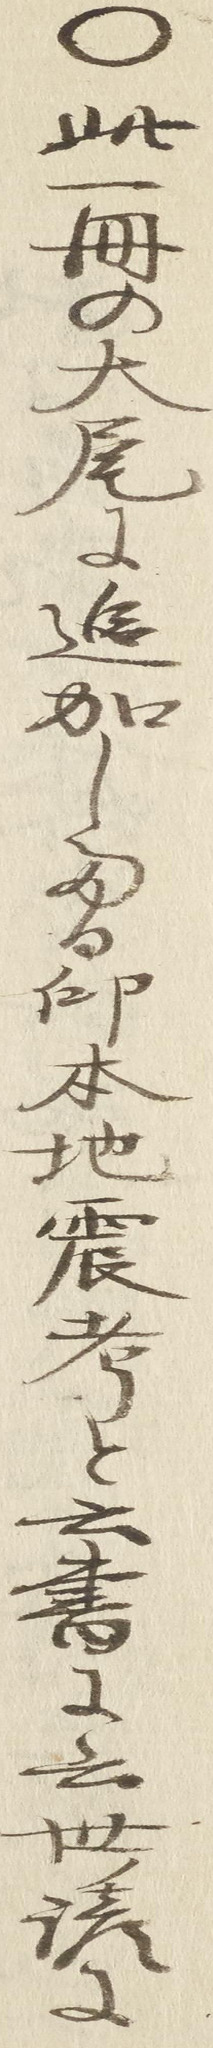〇此一冊の大尾に追加したる印本地震考と云書に云世の諺に
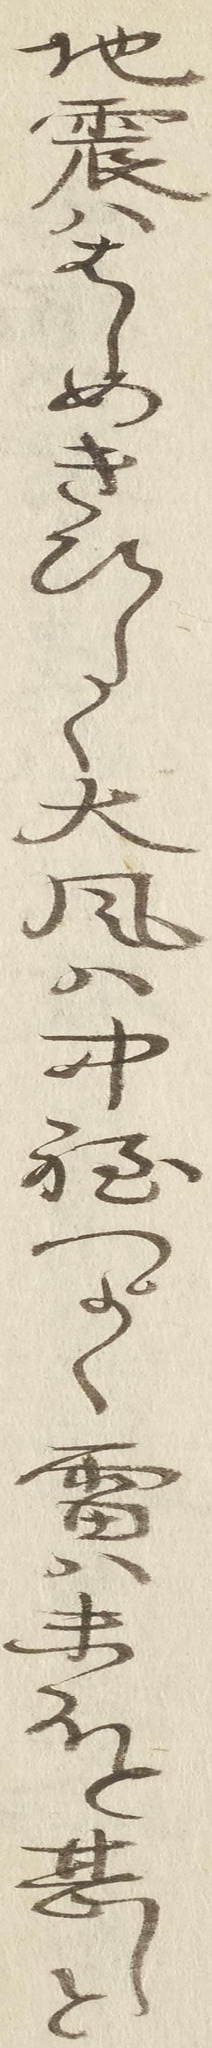地震ははしめきひしく大風は中程つよく雷は末ほと甚しと
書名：地震記　上
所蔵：東京大学地震研究所図書室 Earthquake Research Institute Library, The University of Tokyo, JAPAN
